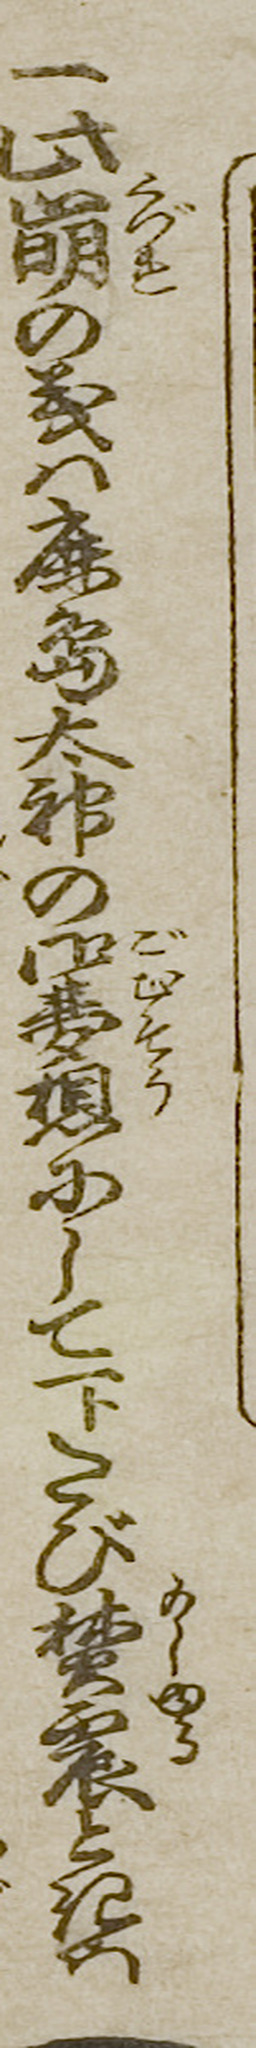一此崩の義は鹿島太神の御夢想にして一とたび焚震ときは
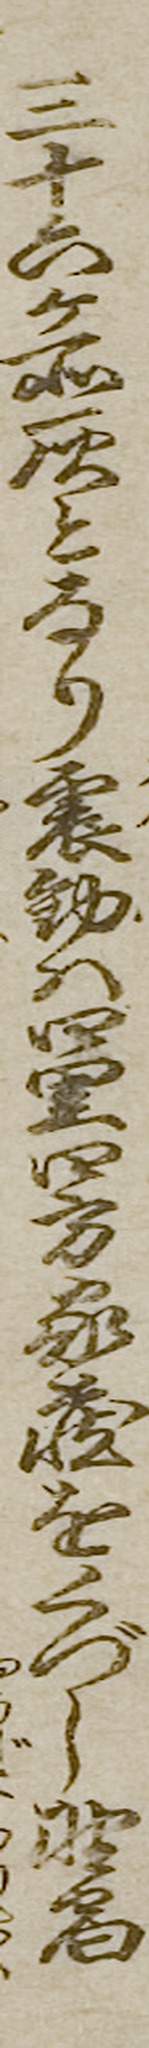三十六ヶ所灰となり震動は四里四方家蔵をくづし野宿
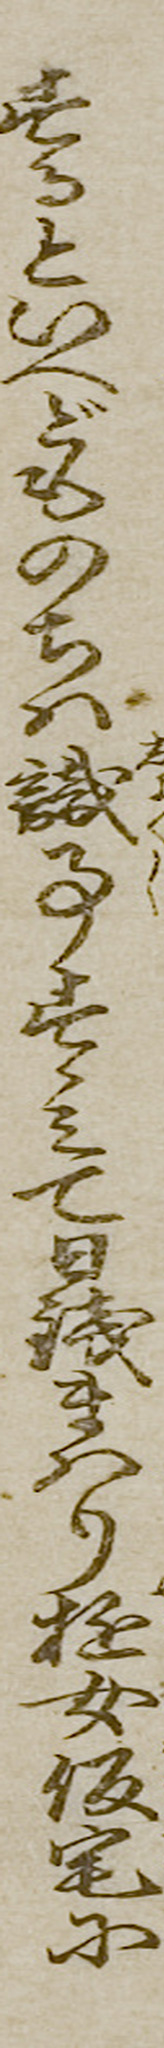するといへどものちは識事すゝみて日銭まはり遊女仮宅に
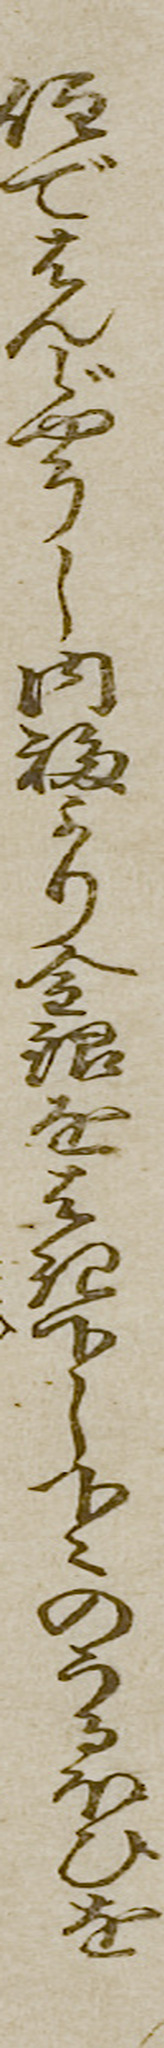住ではんじやうし内福より金銀をはき下し下〻のうるほひを
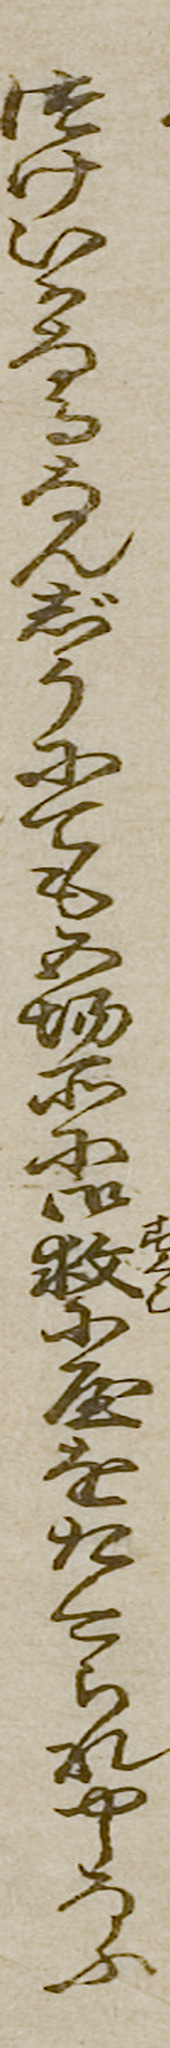つけいかなるなんじうにても五場所に御救小屋をたてられやしなふ
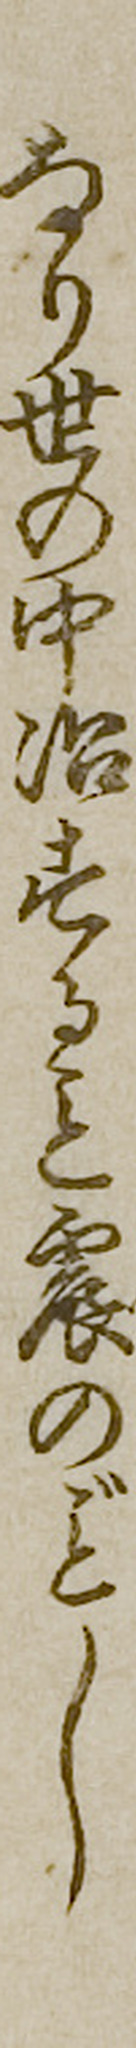なり世の中治すること震のごとし
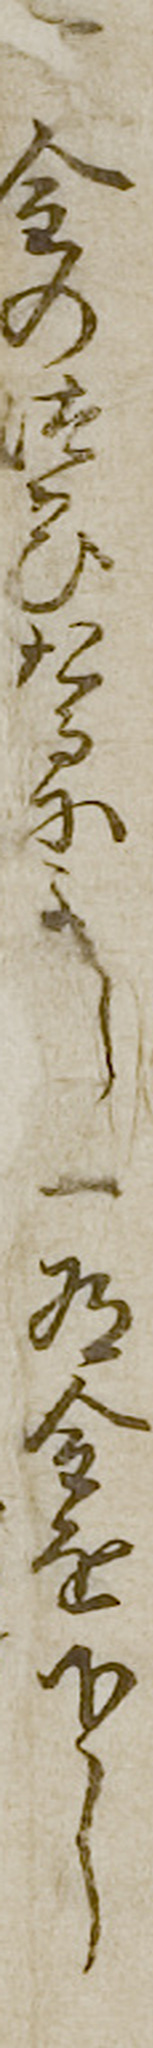一金のつかひたるによし一為金を下し
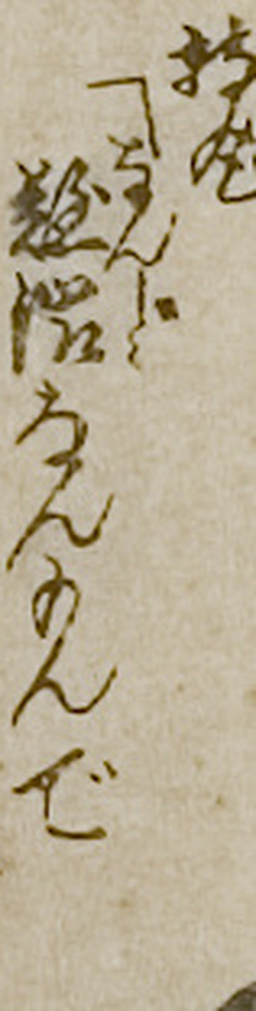〽難渋なんもんで
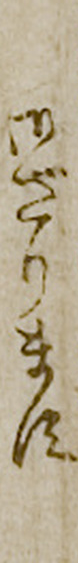御ざります
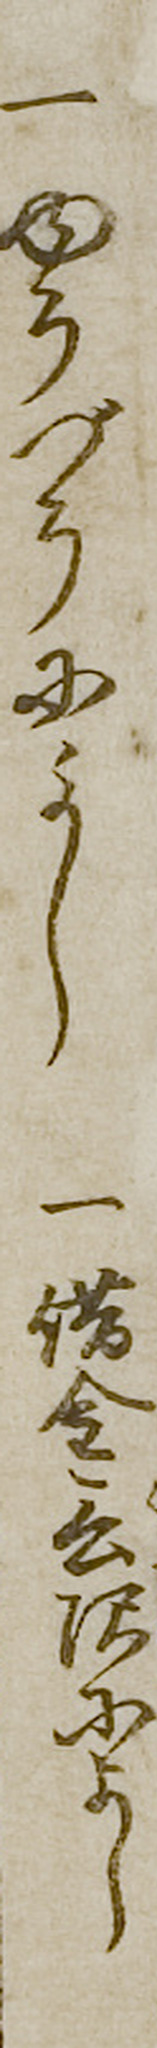一ゆうづうによし一借金言訳によし
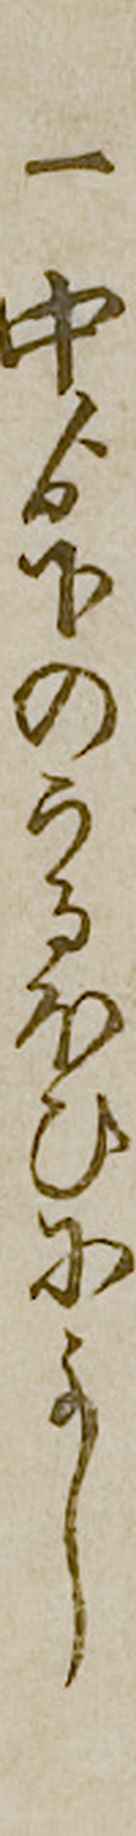一中ゟ下のうるほひによし
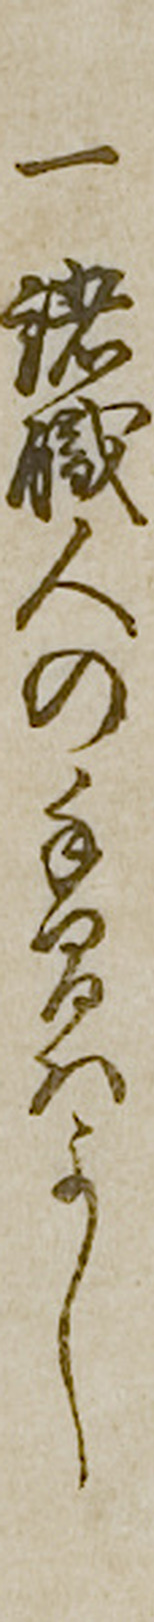一諸職人の手間はよし
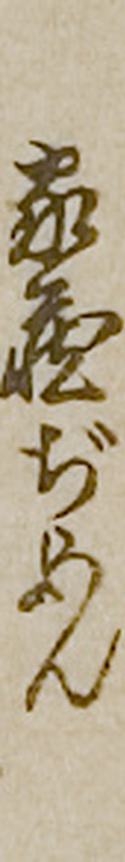家蔵ぢめん
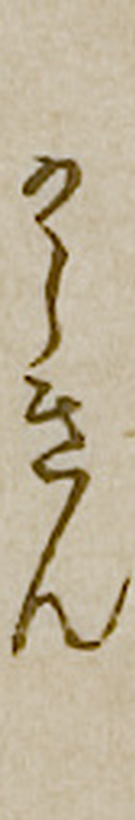かしきん
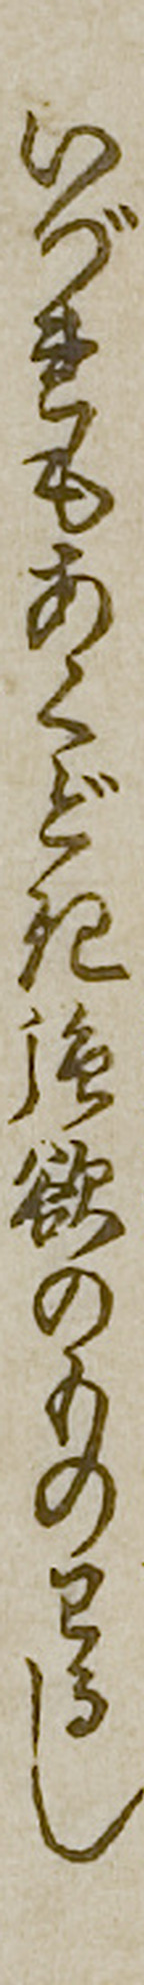いづれもあくどき強欲のものわるし
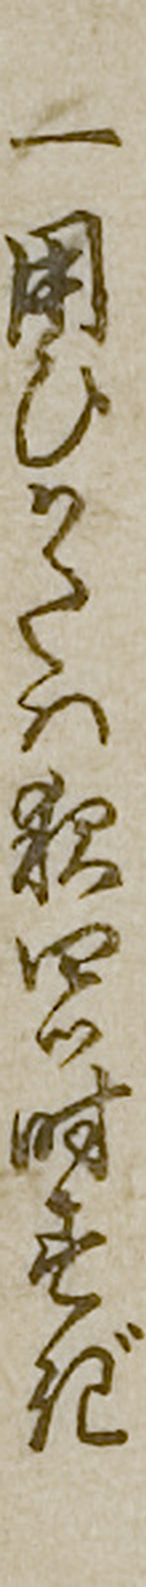一用ひかたは夜四つ時すぎ
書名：ぢしんミやうさく下徳参
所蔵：東京大学総合図書館 General Library in the University of Tokyo, JAPAN
